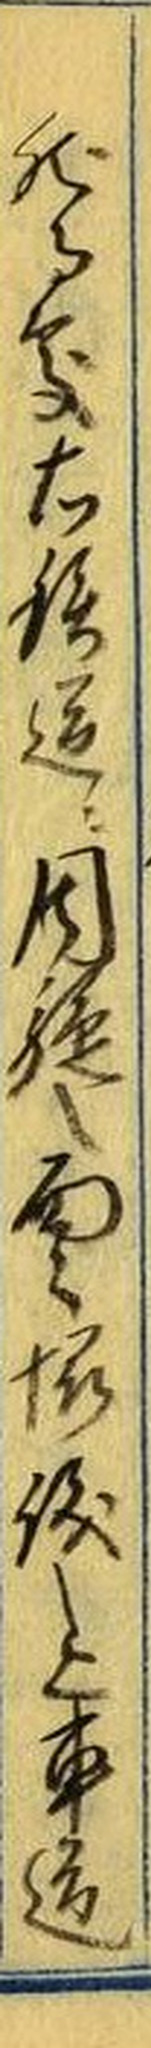然る処右鉄道に周旋之面々協議之上車道
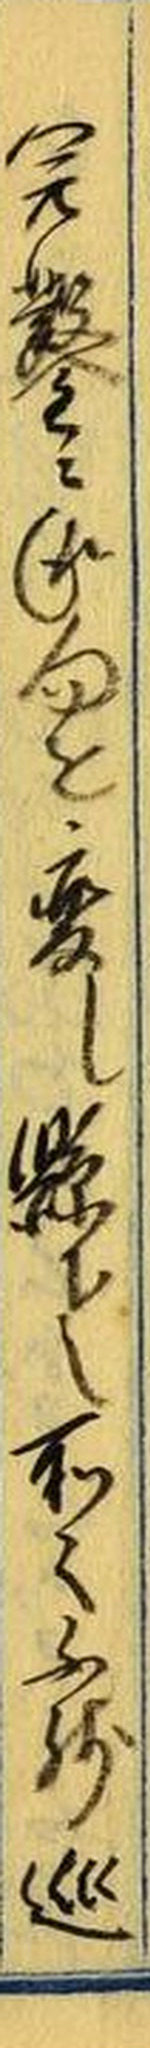開鑿に趣向を変し県下之所々不残巡
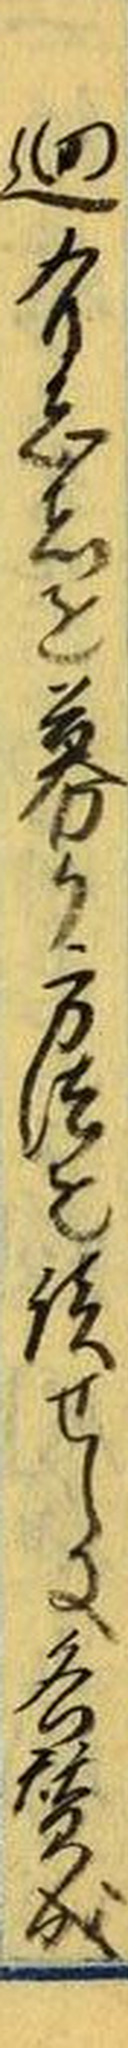廻有志者を募り方法を談せしに各賛成
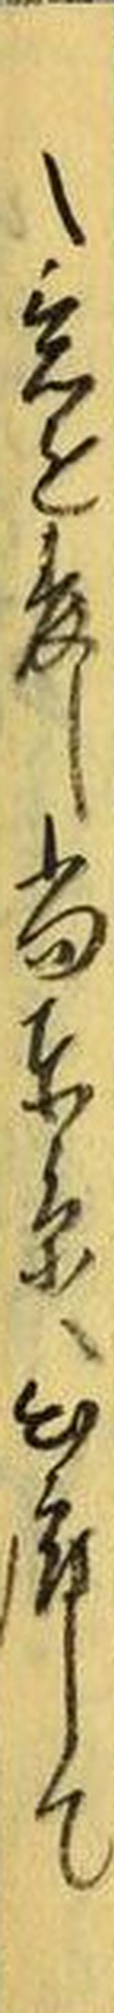之意を表し尚東京へ出府して
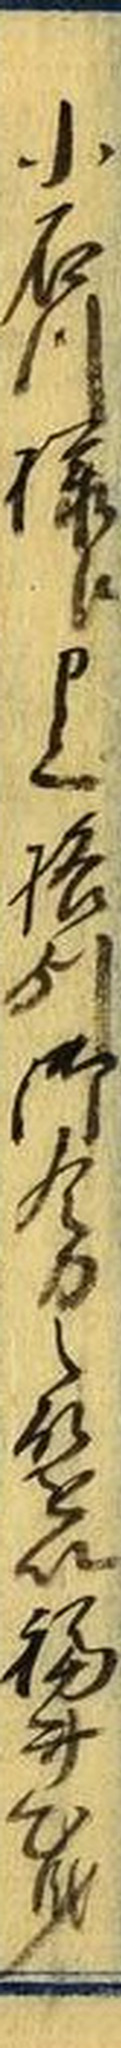小石川様え申上格別御尽力之故を以福井出身
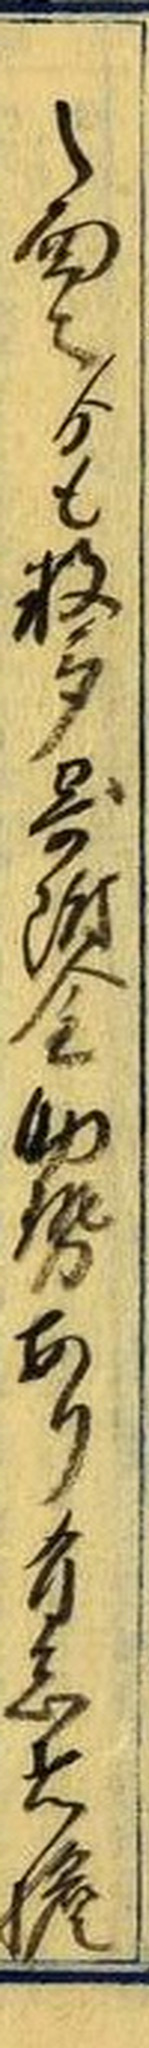之面々ゟも数多寄附金助勢あり有志者担
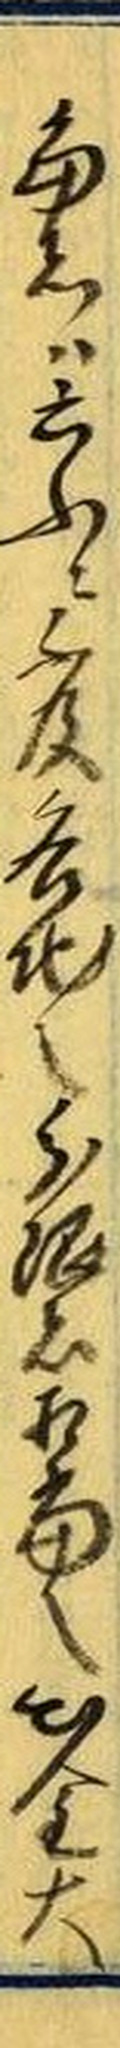当者は言ふに不及各地之分限者相当之出金大
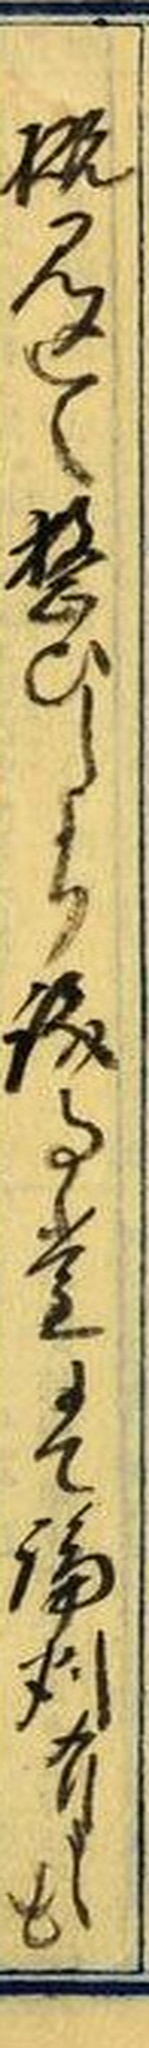概見込之整ひしより議事堂にて論判有しも
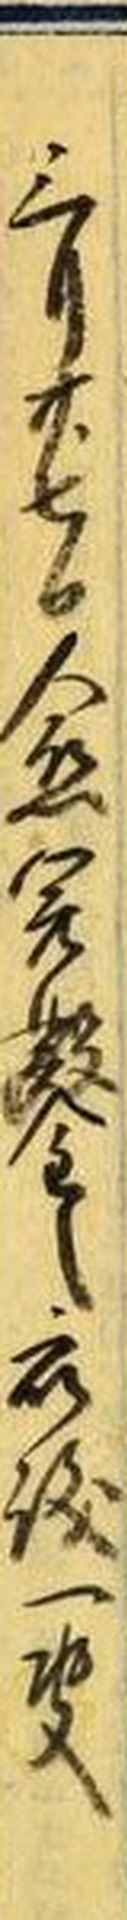三月廿七日愈開鑿之衆議一決
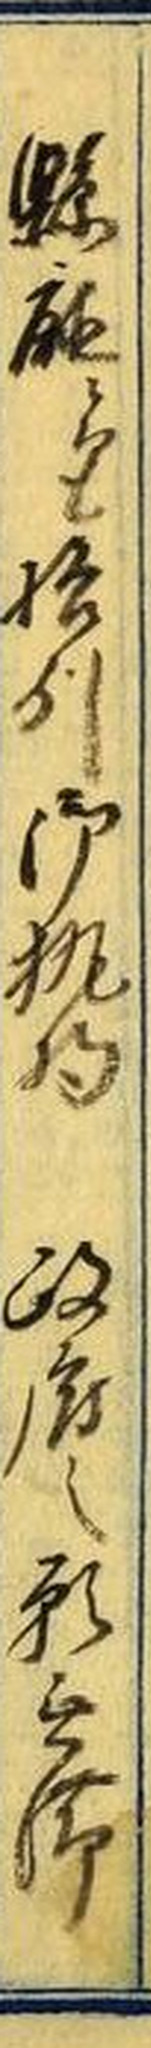県庁に而も格別執持政府之願無滞
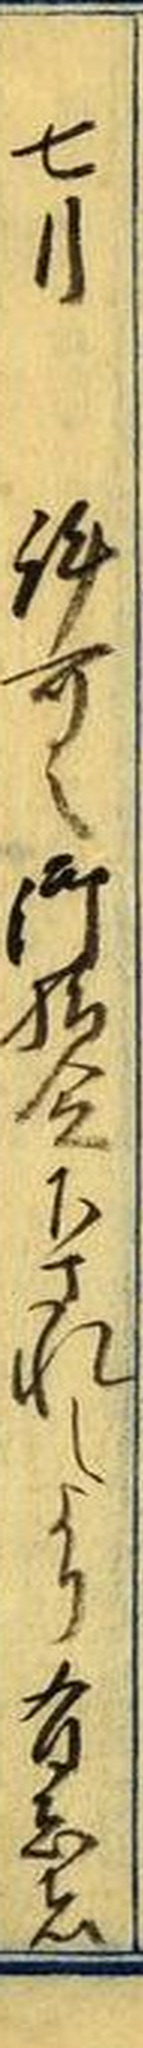七月許可之御指令下されしより各有志者
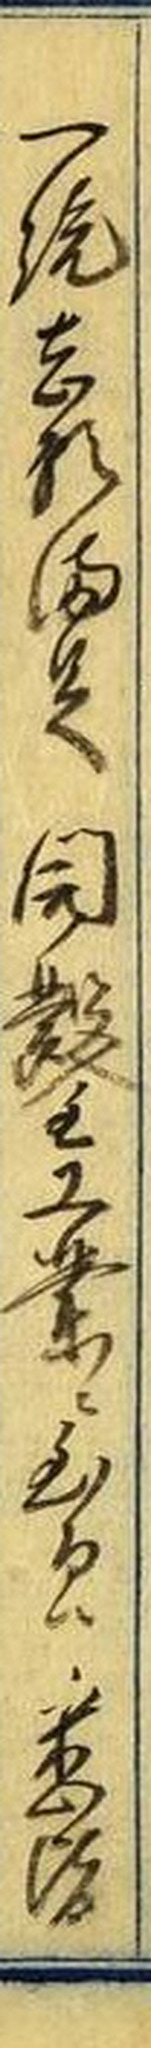一統志願満足開鑿工業に至るは悉皆
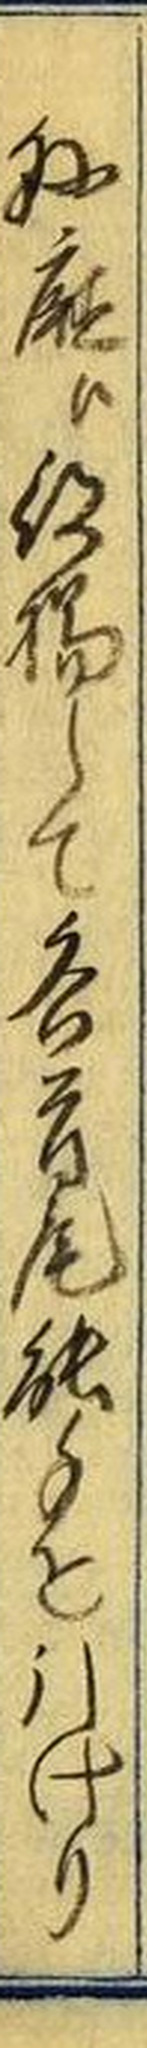県庁え役場して各首尾能手を引けり
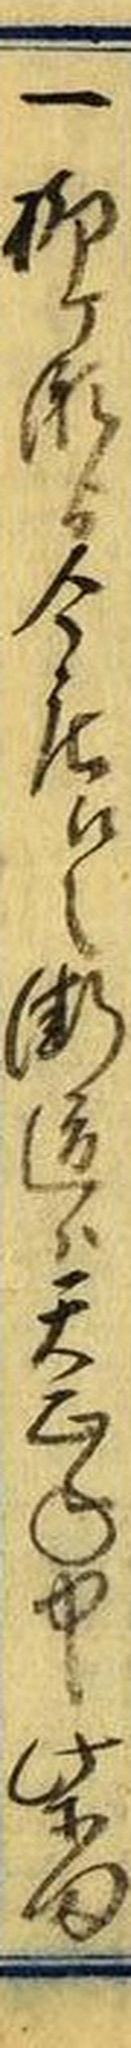一柳ヶ瀬ゟ今庄え之街道は天正年中柴田

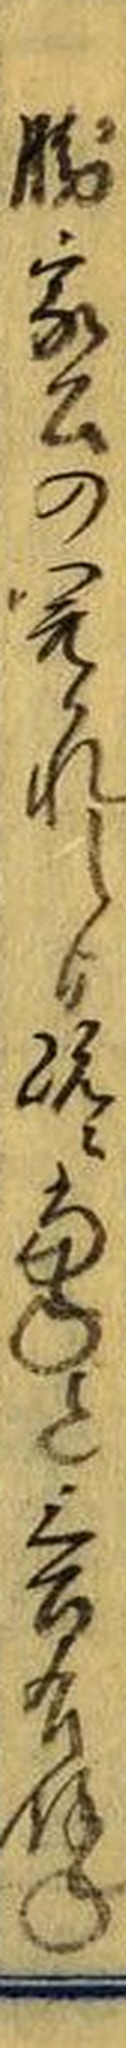勝家公の開かれしゟ既に当年迄三百有余年
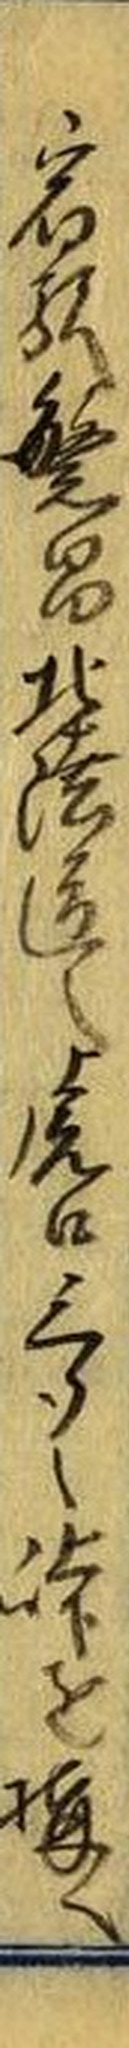宿駅繁昌北陸道之虎口三ッ之峠を構へ
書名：温古集 五巻
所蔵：福井県文書館 Fukui Prefectural Archives
